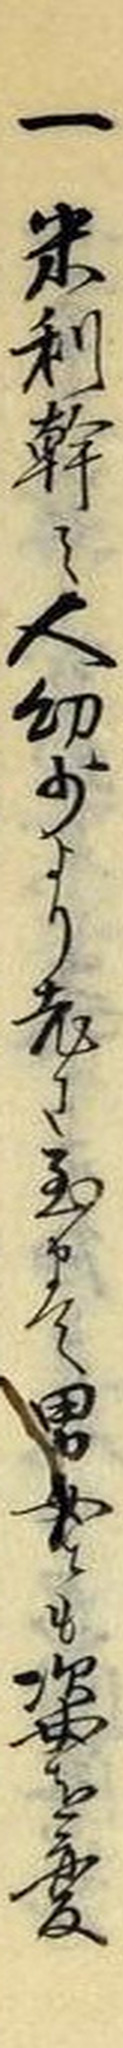一米利幹之人幼少より老に至まて男女とも姿を変
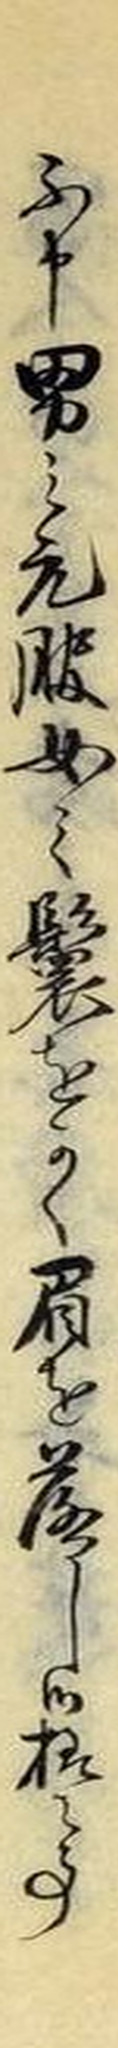不申男之元服女之鬟をかく眉を落し候様之事
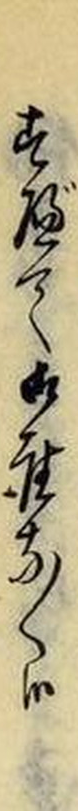すべて御座なく候
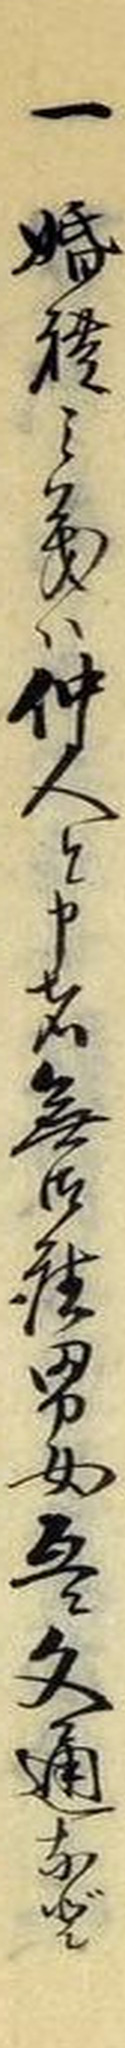一婚礼之義は仲人と申者無御座男女互ニ文通など
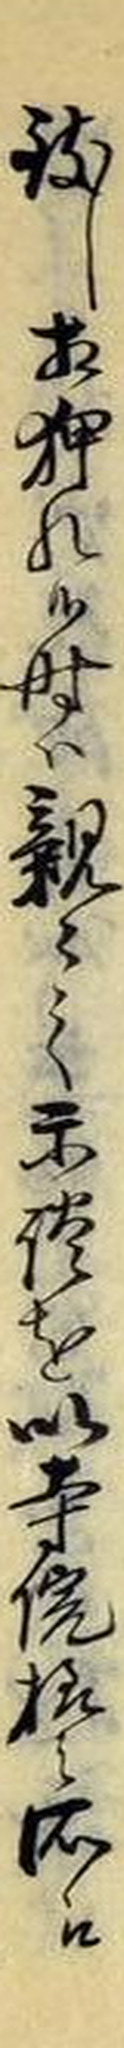致し相狎れ候時ハ親々之示談を以寺院様之所江
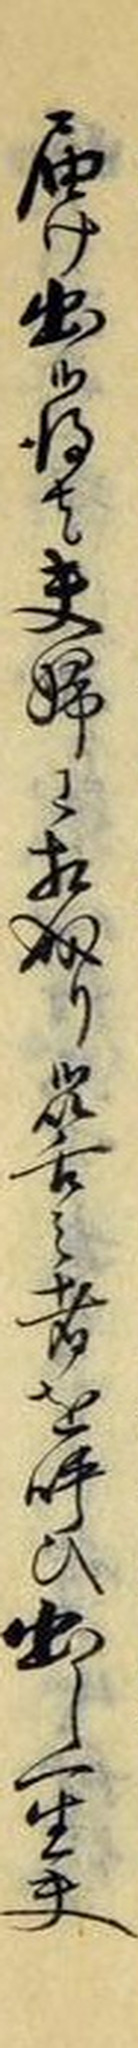届け出候得者夫婦に相成り候筈之者を呼ひ出し一生夫

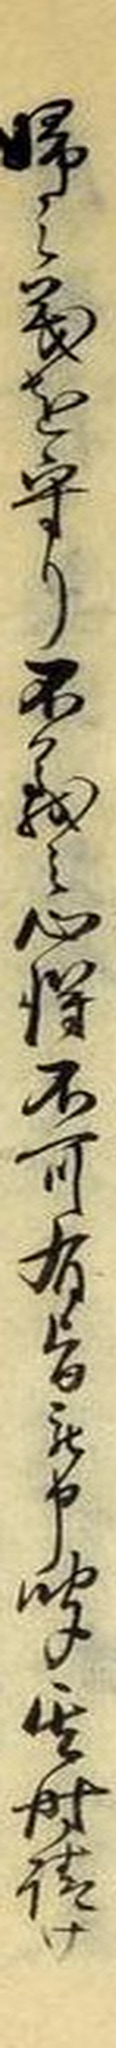婦の義を守り不義の心得不可有旨被申聞其時請け
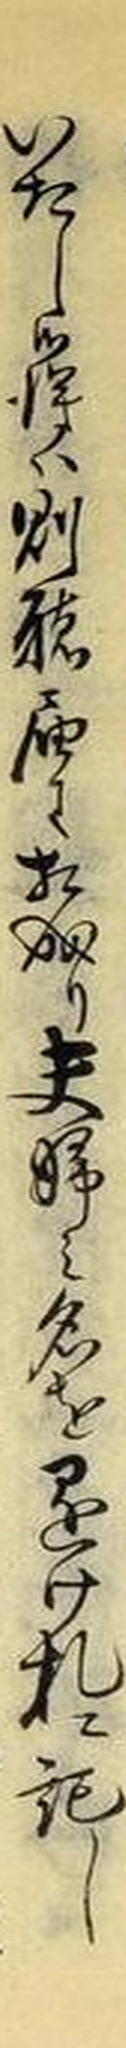いたし候得ハ則願届に相成り夫婦之名を懸け札ニ記し
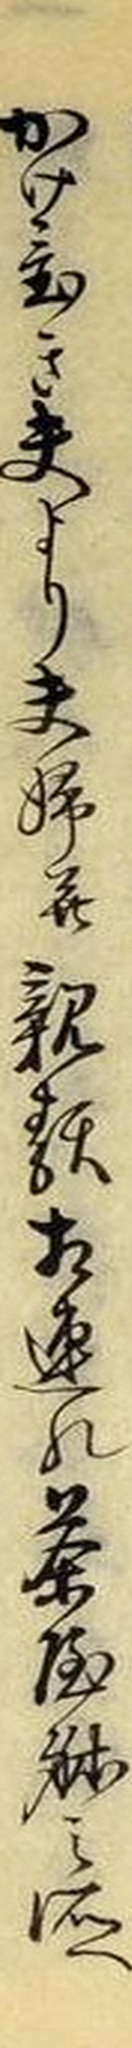かけ置き夫より夫婦並親類相連れ茶屋躰之所へ
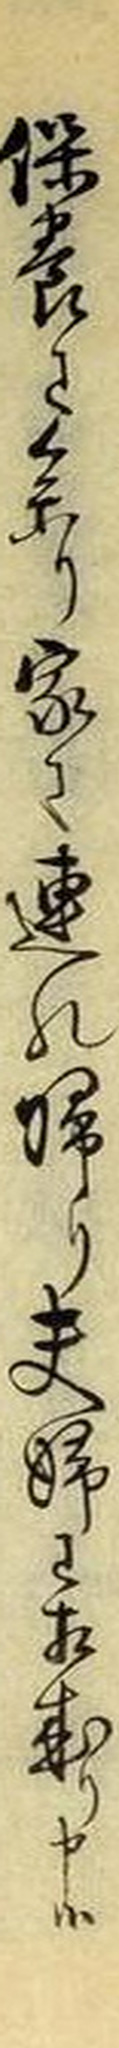保養に参り家に連れ帰り夫婦に相成り申候
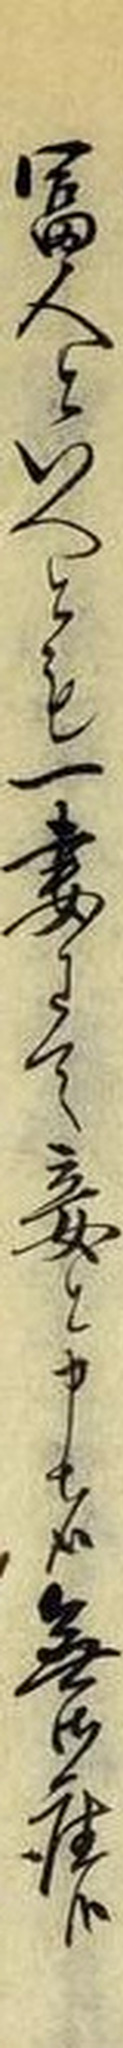富人といへとも一妻に妾と申者無御座候
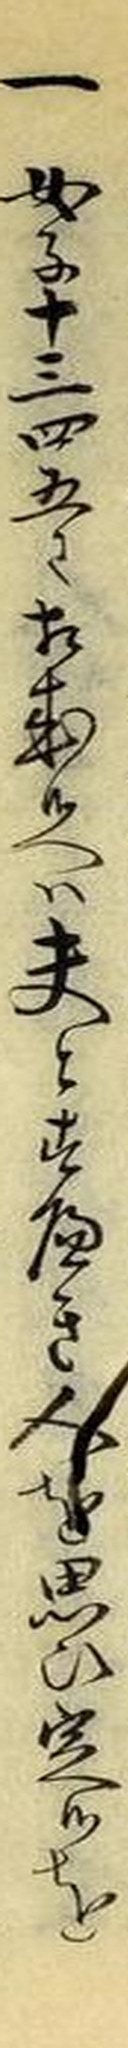一女子十三四五に相成候へハ夫とすへき人を思ひ定候を
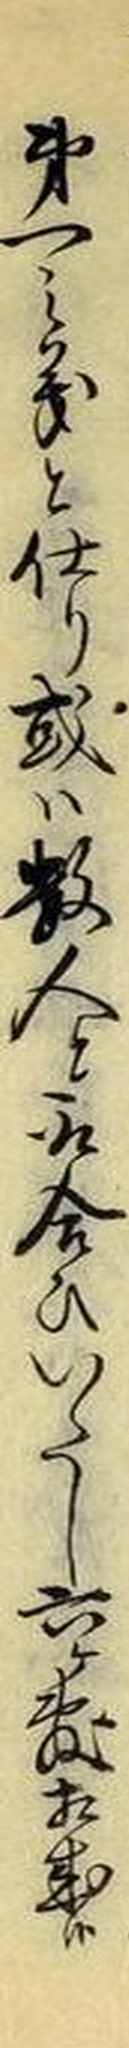第一之義と仕り或ハ数人と取合ひいたし六ヶ敷相成候
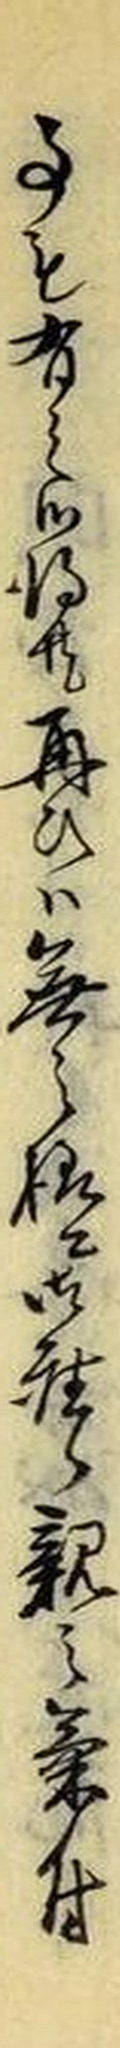事も有之候得共再ひハ無之様ニ御座候親之気付
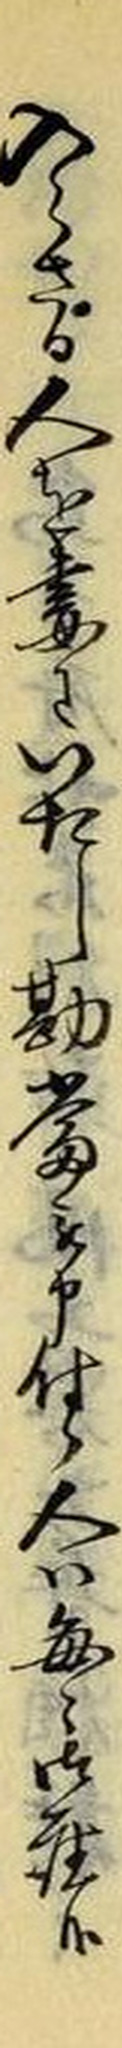入らさる人を妻にいたし勘當被申付候人ハ毎々御座候
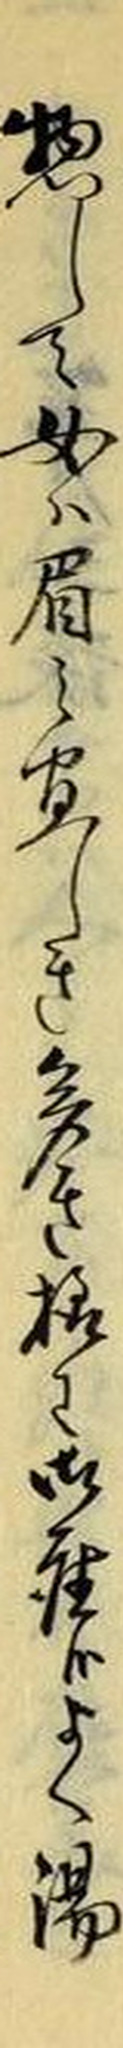惣して女ハ眉之宜しき多き様に御座候よく湯
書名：漂客談奇（備考雑録写8）
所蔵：福井県文書館 Fukui Prefectural Archives
